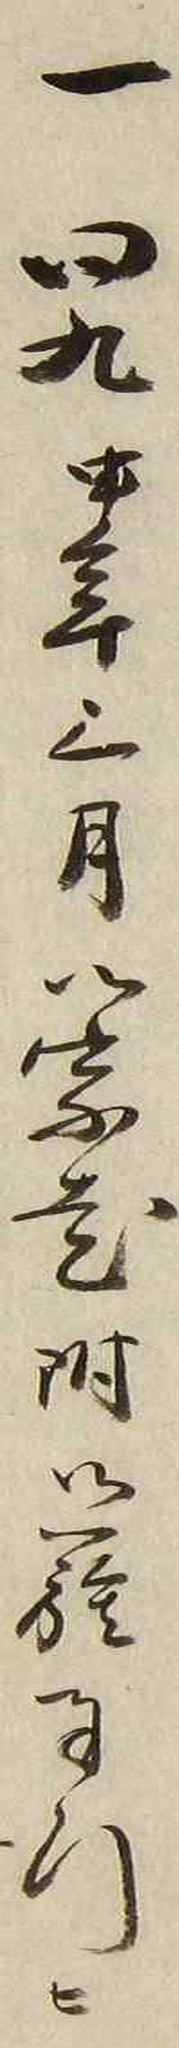一同九申年三月御家老附御簱奉行被
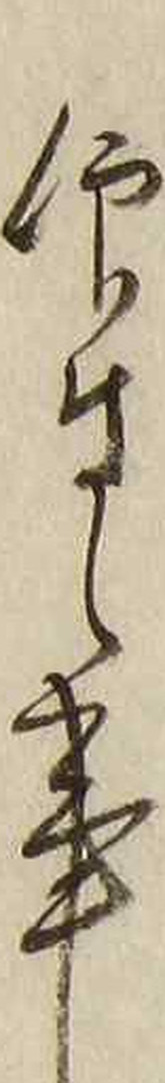仰付候事

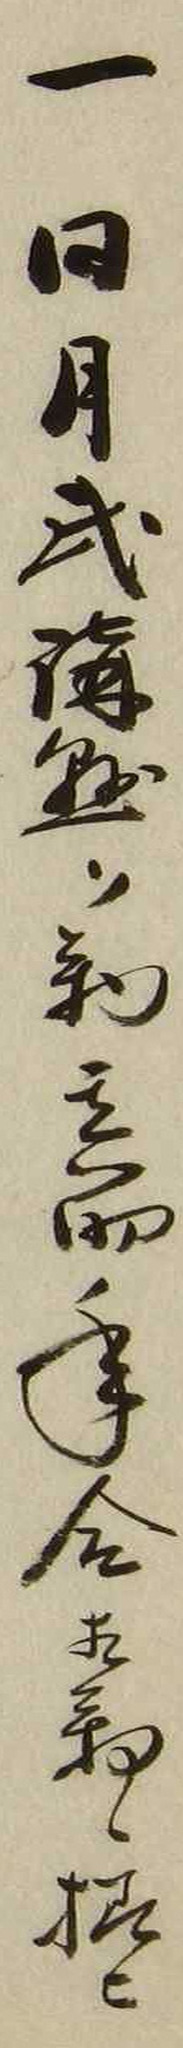一同月武講懸り勤其筋手合相勤候様被
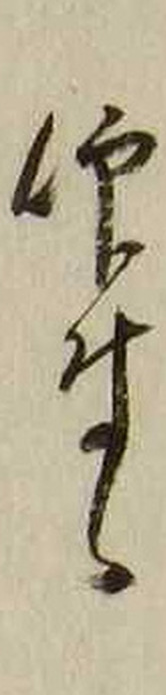仰付候
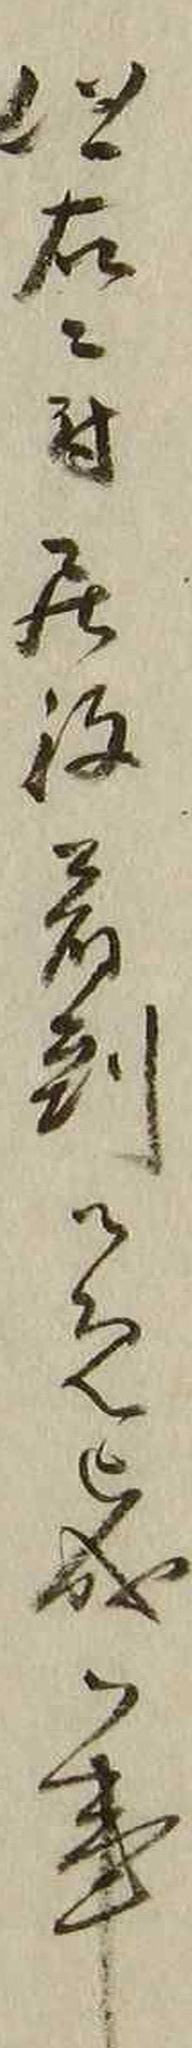但右ニ付居役着到御免被成候事
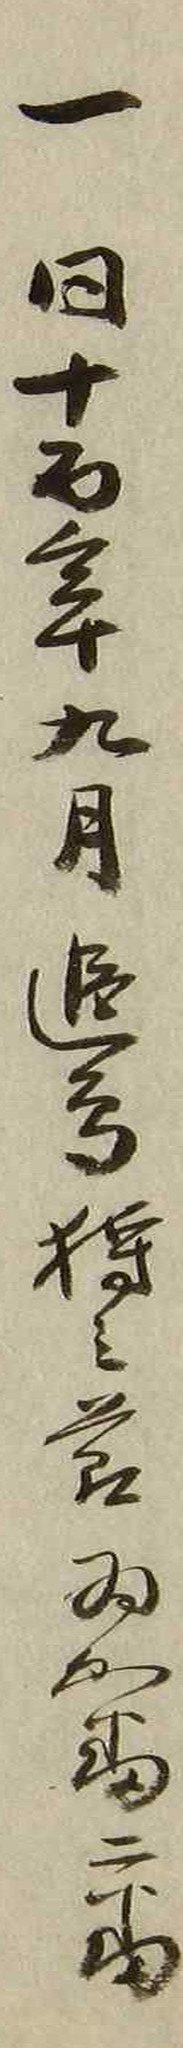一同十酉年九月追鳥狩之節為加番二番
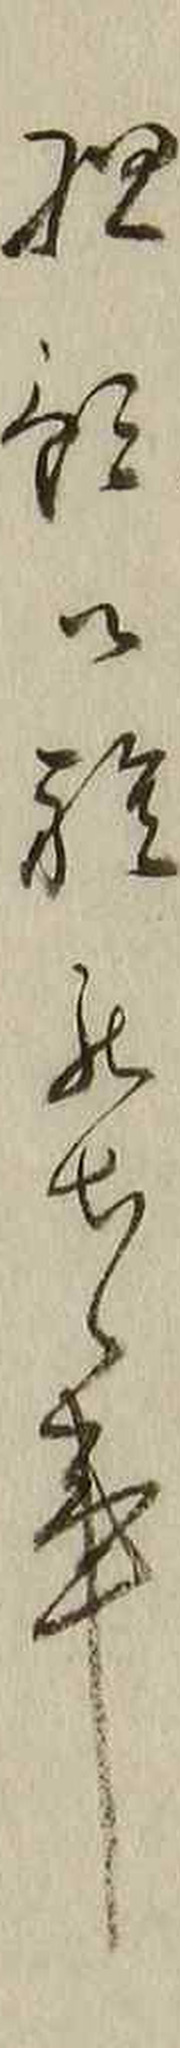組預御旗罷出候事
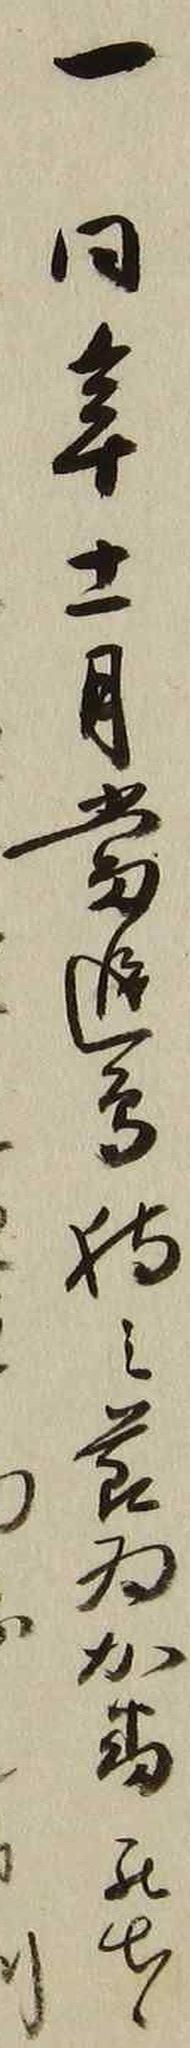一同年十一月当追鳥狩之節為加番罷出候
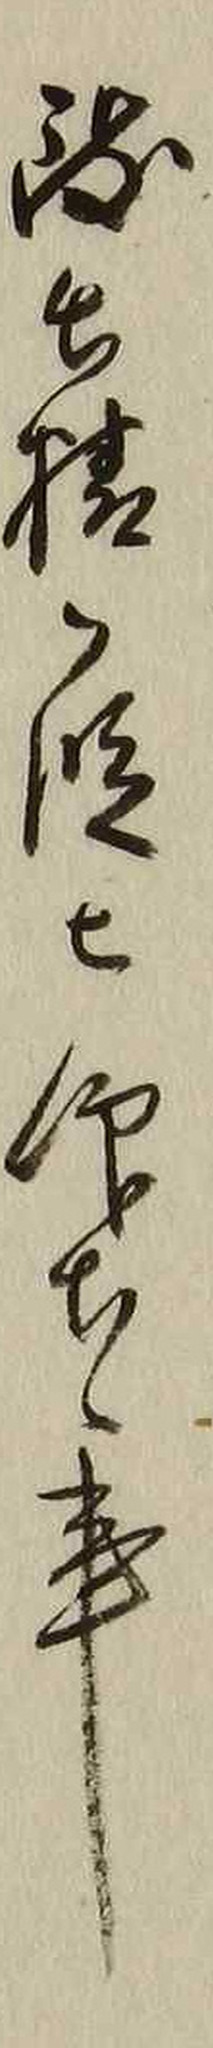致出精候段被仰出候事
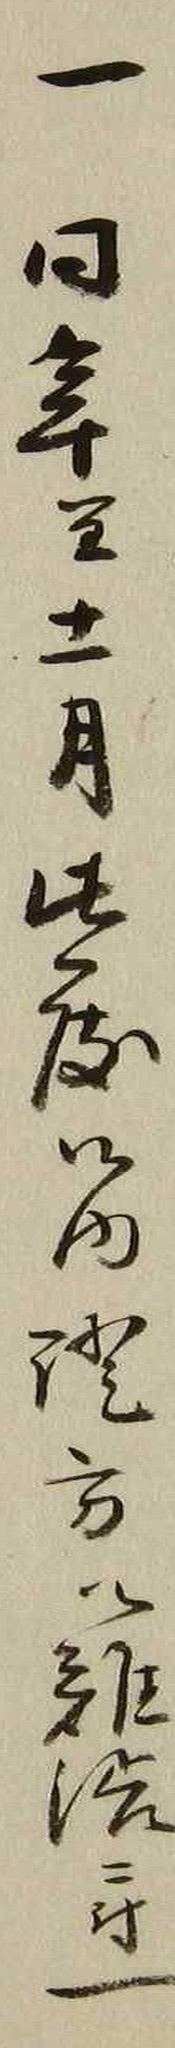一同年閏十一月此度御内証方御難渋ニ付一
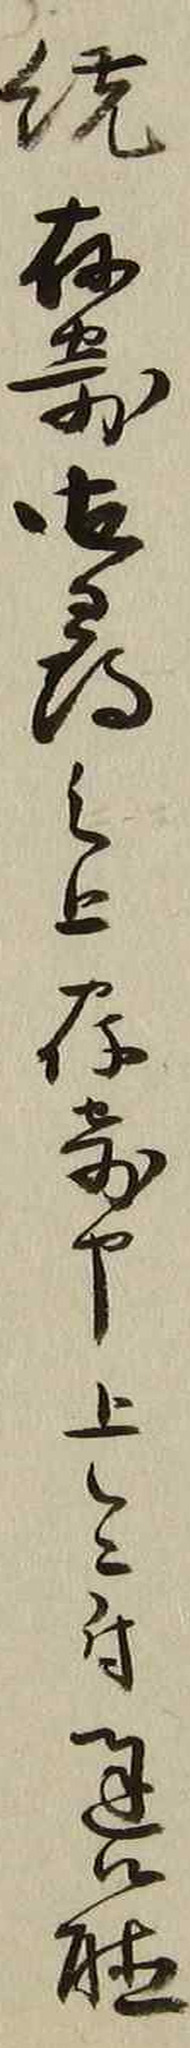統存寄御尋之上存寄申上候ニ付達御聴
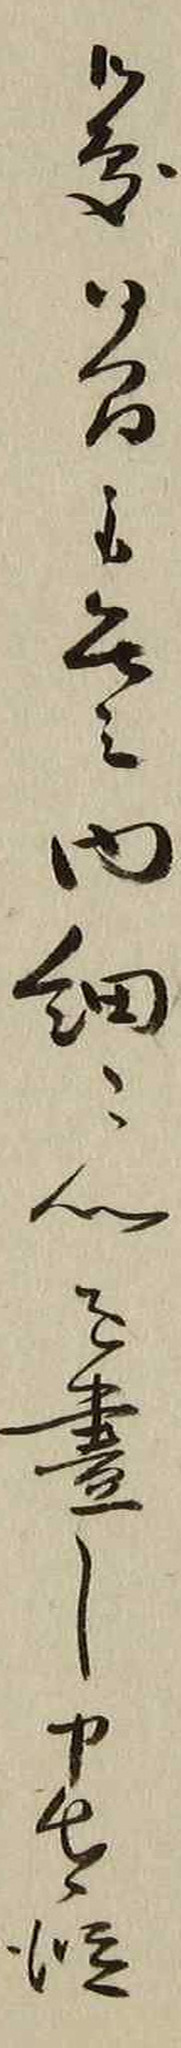候処御間も無之内細々心を尽し申出候段
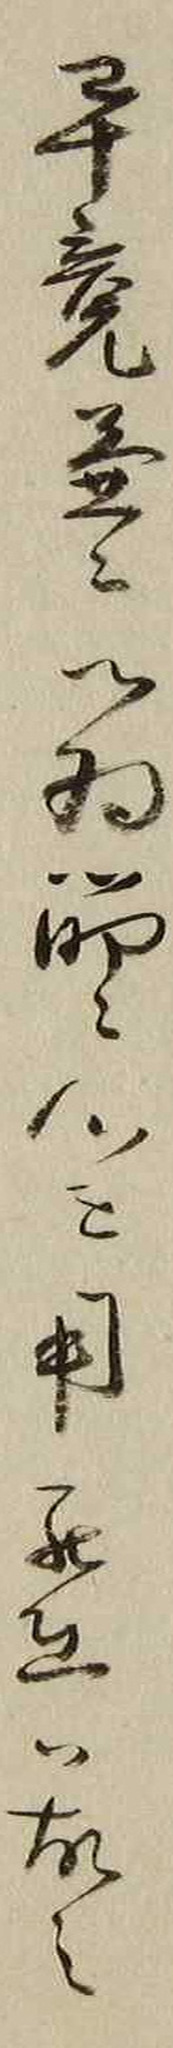畢竟兼々御為筋々心を用罷在候故之
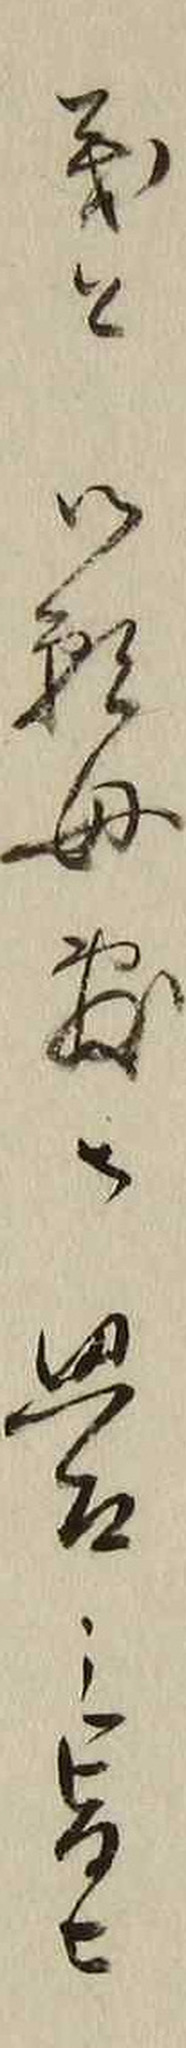義と御頼母敷被思召之旨被
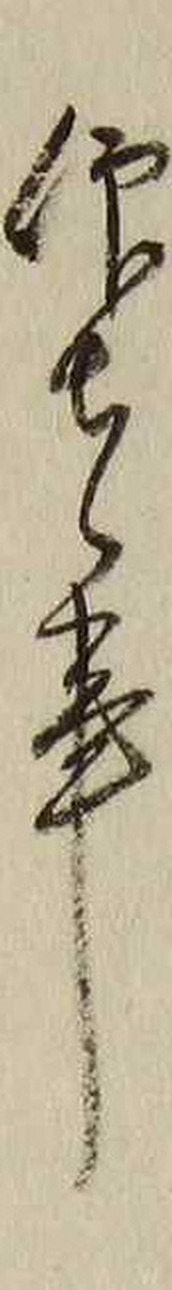仰出候事
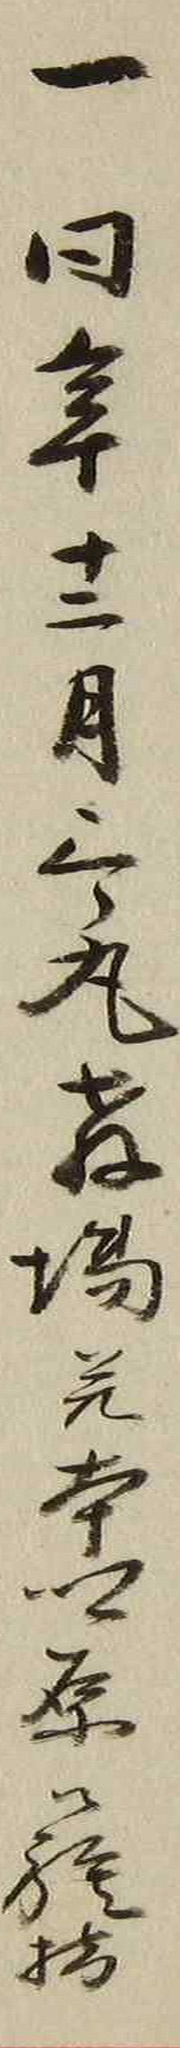一同年十二月三ノ丸教場并本郷原御旗指
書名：諸士系譜　巻之311　し之部1
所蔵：会津若松市立会津図書館
